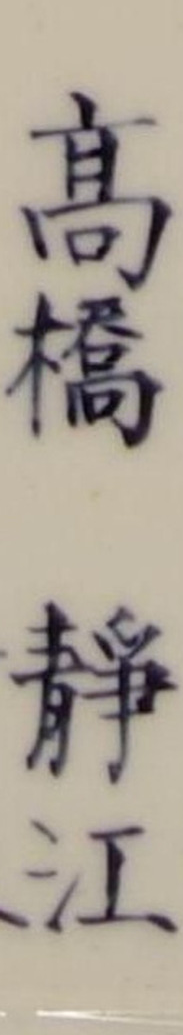高橋静江
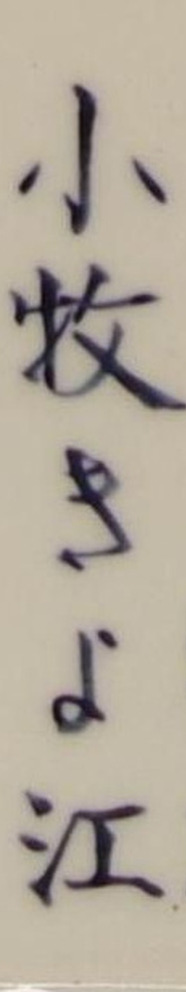小牧きよ江
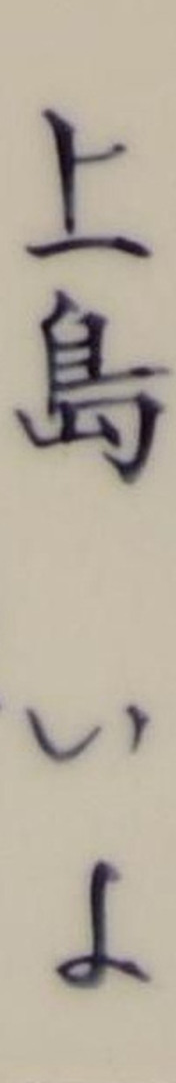上島いよ
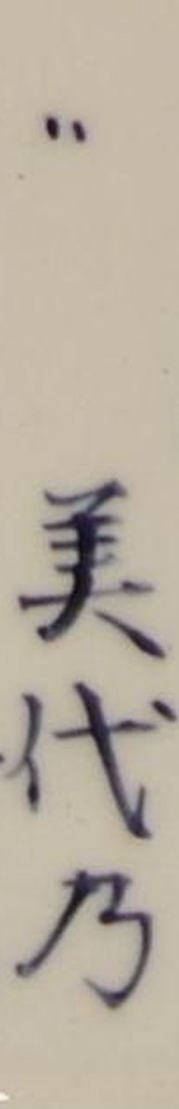美代乃
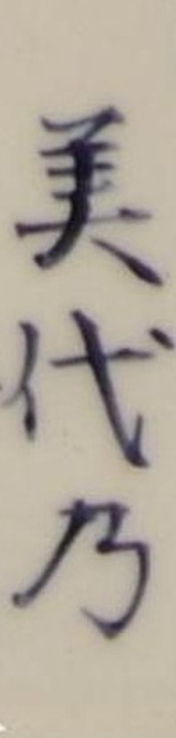美代乃
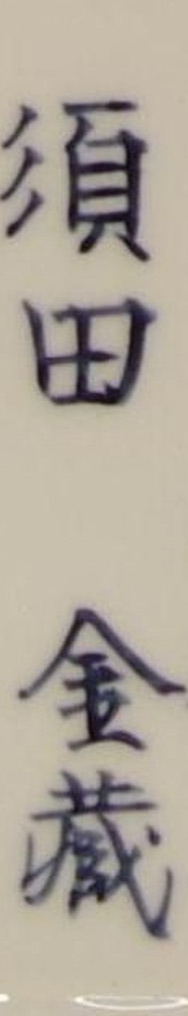須田金蔵
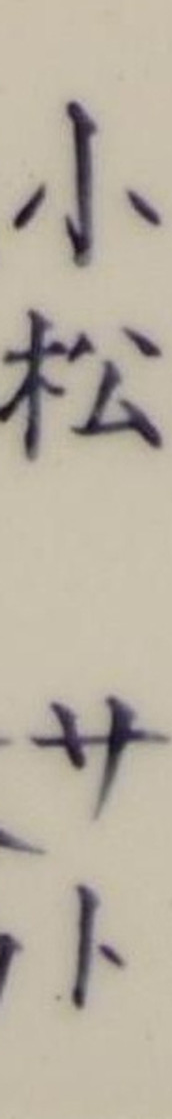小松サト
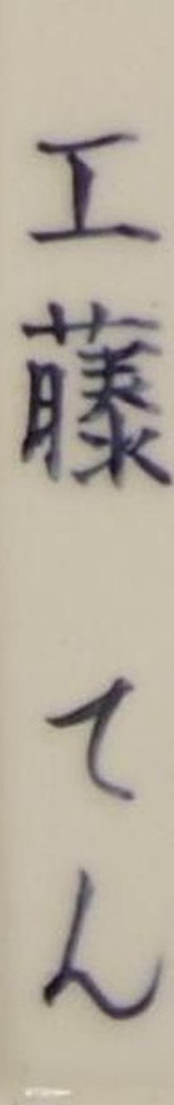工藤てん

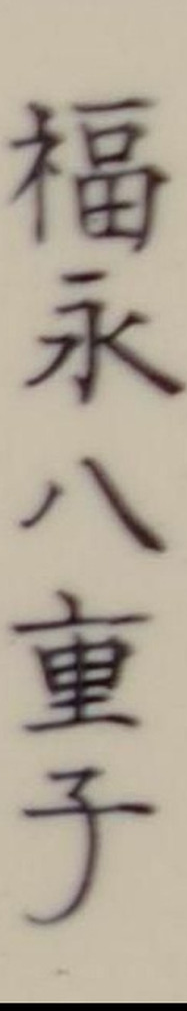福永八重子
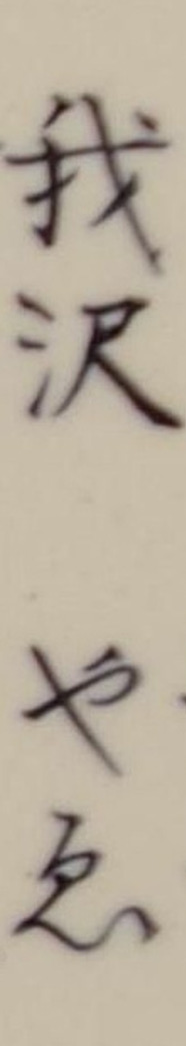我沢やゑ
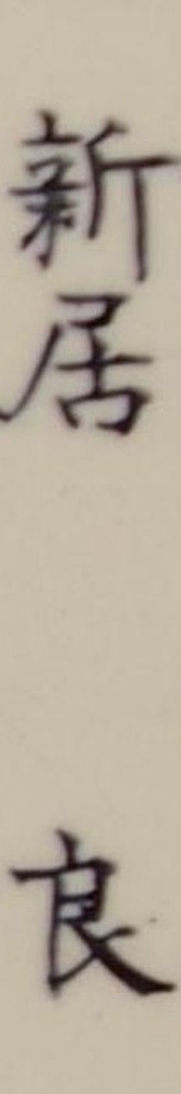新居良
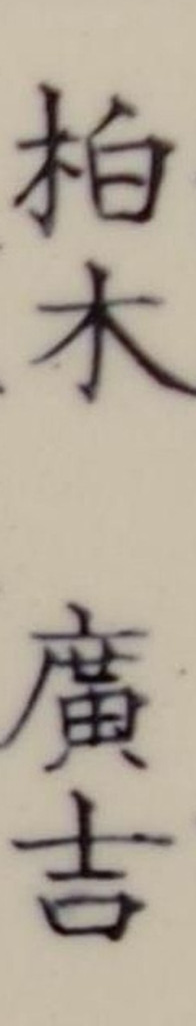柏木広吉
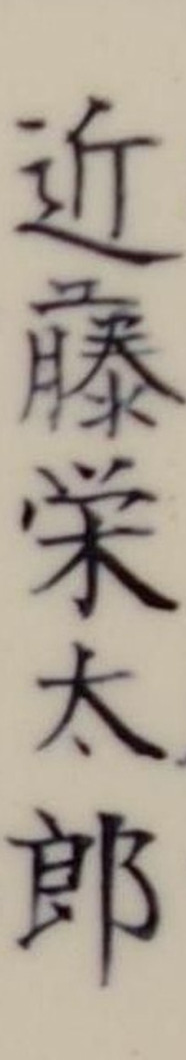近藤栄太郎
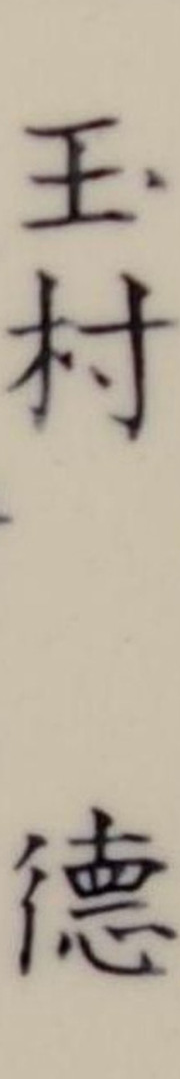玉村徳
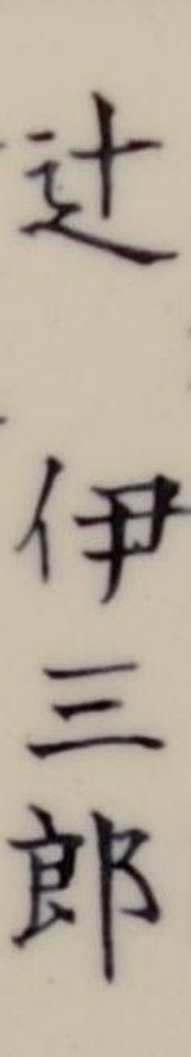辻伊三郎
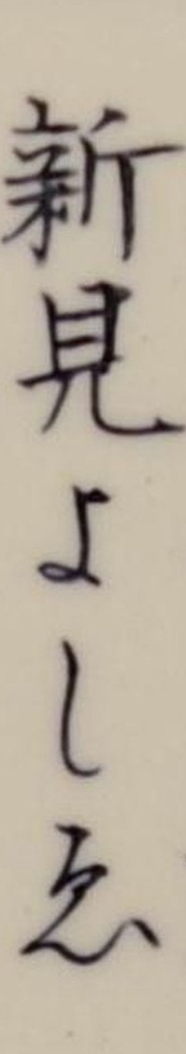新見よしゑ
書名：M~S
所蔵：高野山金剛峯寺
